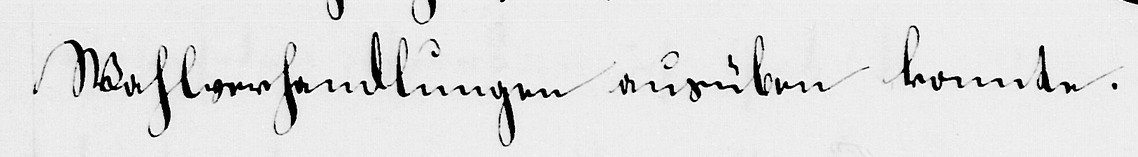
Wahlverhandlungen ausüben konnte.
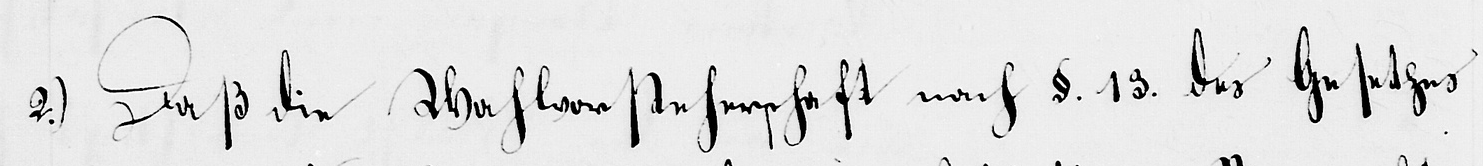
2.) Daß die Wahlvorsteherschaft nach §. 13. des Gesetzes
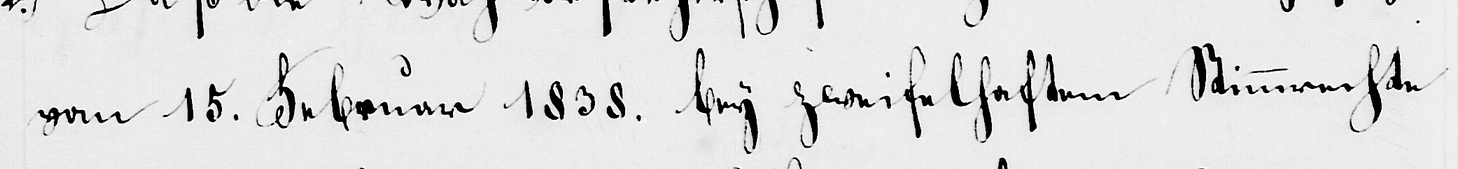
vom 15. Februar 1838. bey zweifelhaftem Stimmrechte
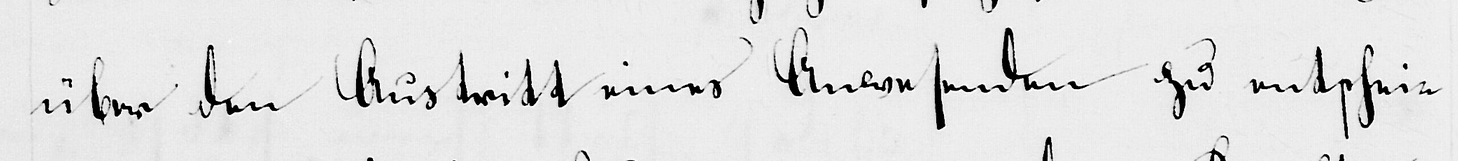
über den Austritt eines Anwesenden zu entschei¬
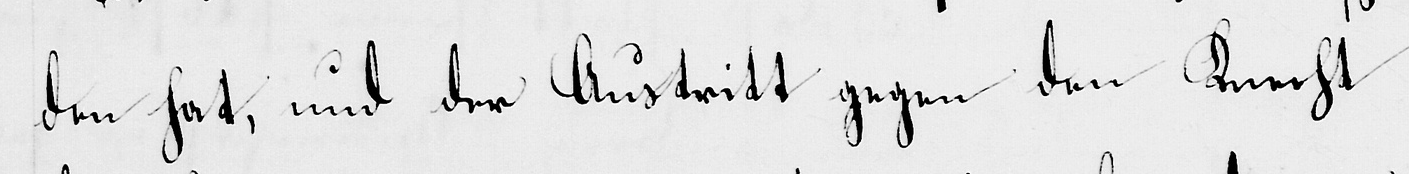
den hat, und der Austritt gegen den Knecht
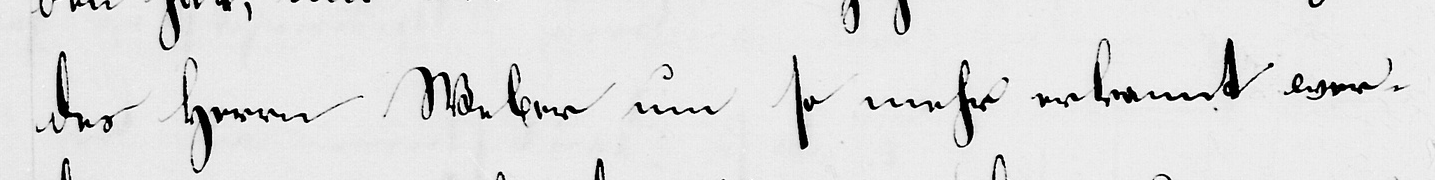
des Herrn Weber um so mehr erkannt wer¬
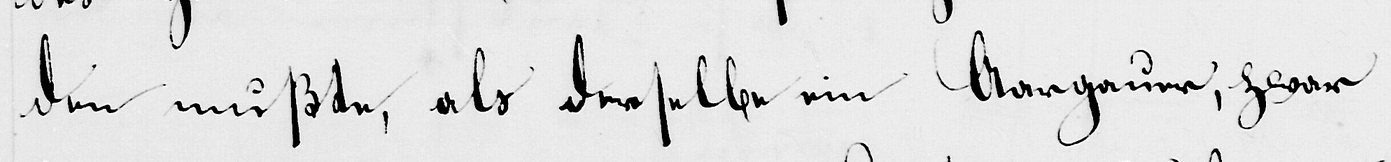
den mußte, als derselbe ein Aargauer, zwar
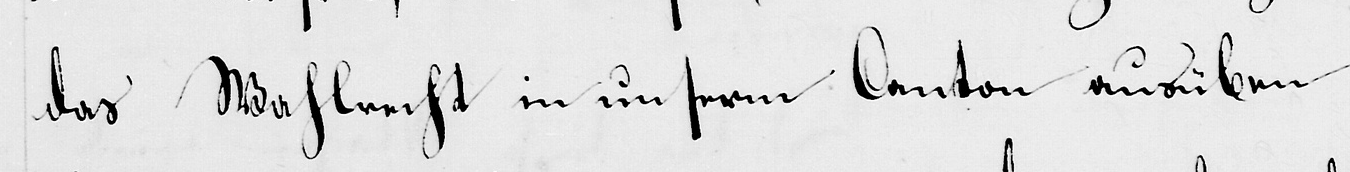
das Wahlrecht in unserm Canton ausüben
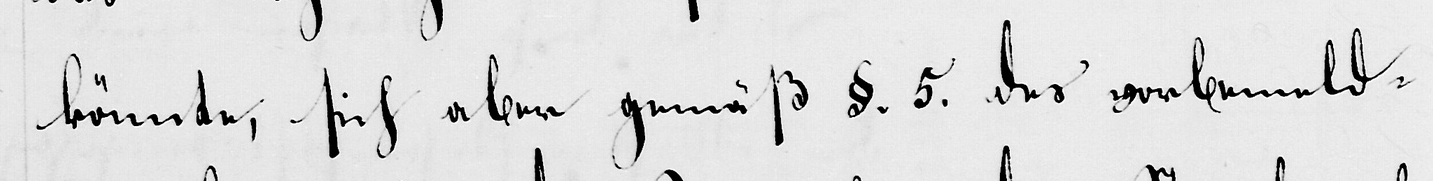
könnte, sich aber gemäß §. 5. des vorbemeld¬
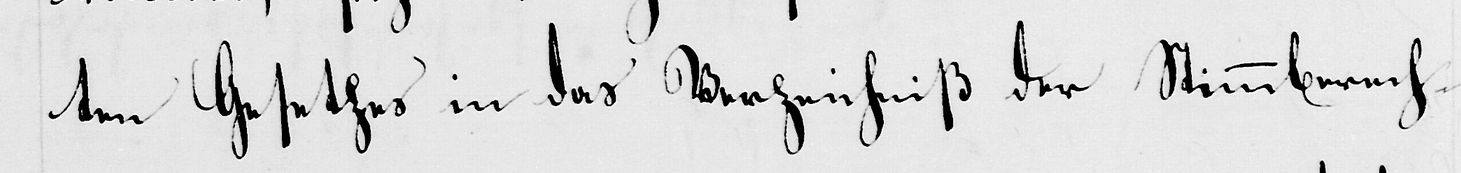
ten Gesetzes in das Verzeichniß der Stimmberech-
